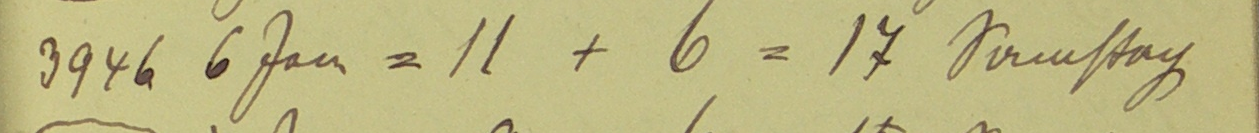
3946 6. Jan. = 11 + 6 = 17 Samstag
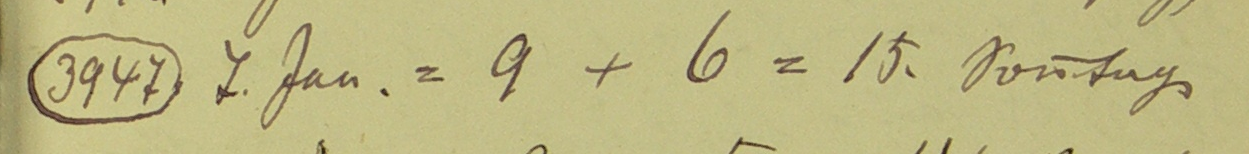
3947 7. Jan. = 9 + 6 = 15 Sonntag
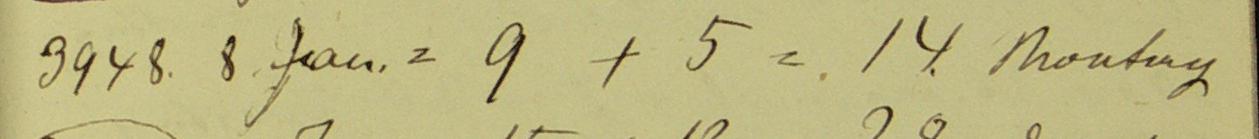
3948 8. Jan. = 9 + 5 = 14 Montag
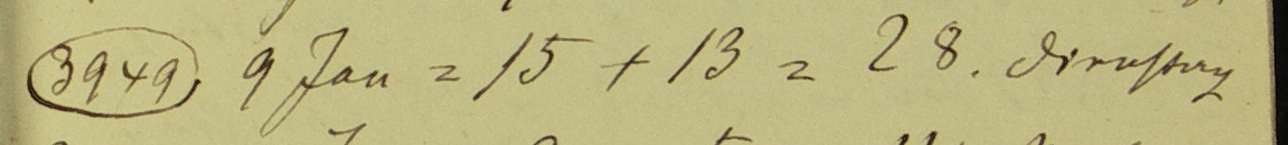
3949 9. Jan. = 15 + 13 = 28 Dienstag
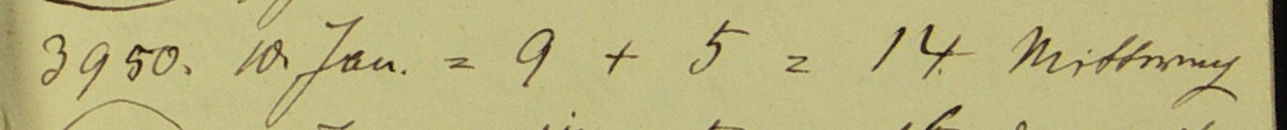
3950 10. Jan. = 9 + 5 = 14 Mittwoch
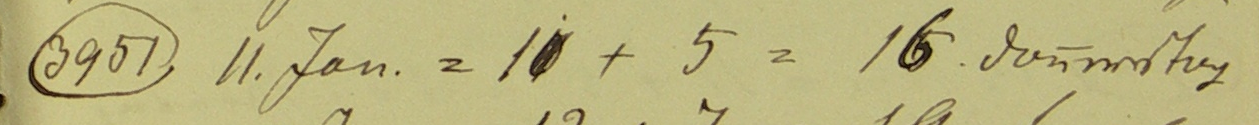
3951 11. Jan. = 10 + 5 = 16 Donnerstag
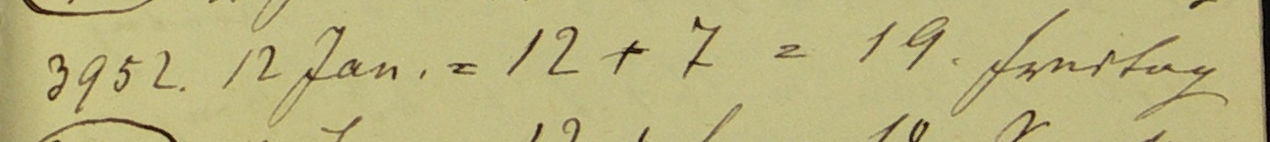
3952 12. Jan. = 12 + 7 = 19 Freitag
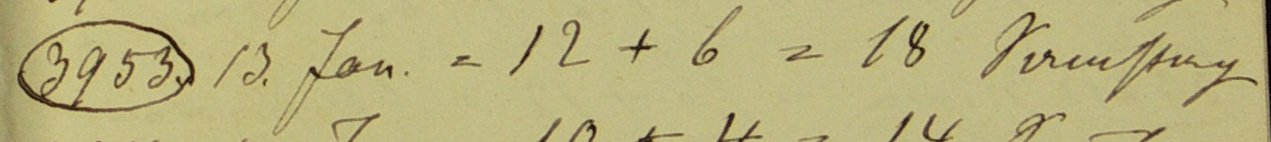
3953 13.Jan. = 12 + 6 = 18 Samstag
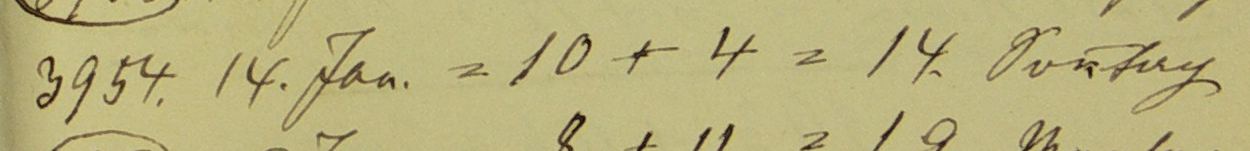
3954 14. Jan. = 10 + 4 = 14 Sonntag
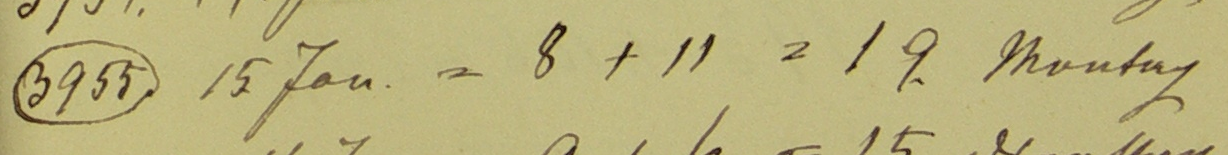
3955 15. Jan. = 8 + 11 = 19 Montag
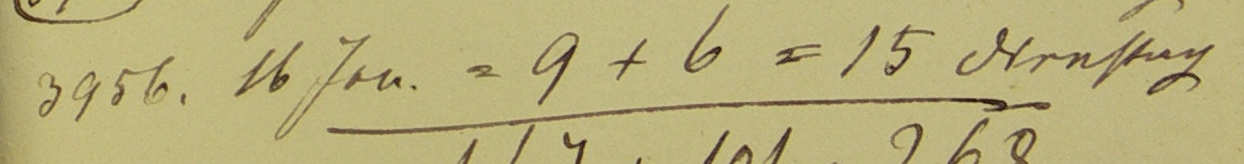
3956 16. Jan. = 9 + 6 = 15 Dienstag
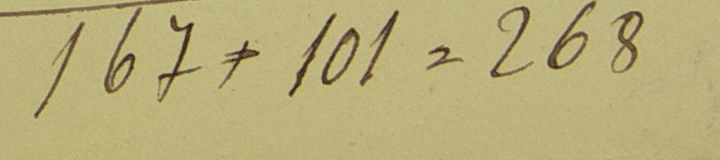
167 + 101 = 268
